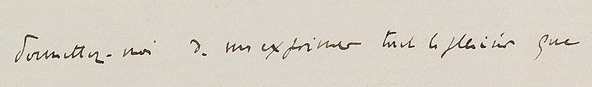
Permettez-moi de vous exprimer tout le plaisir que
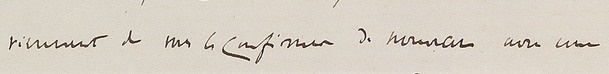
viennent de me le confirmer de nouveau avec une
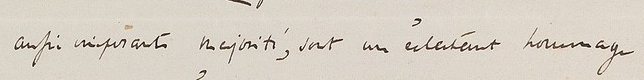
aussi inspirante majorité, sont un éclatent hommage
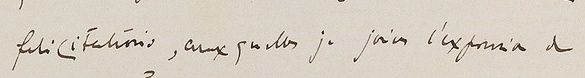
félicitations, auxquelles je joins l'expression de
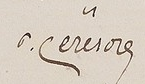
P. Ceresole
